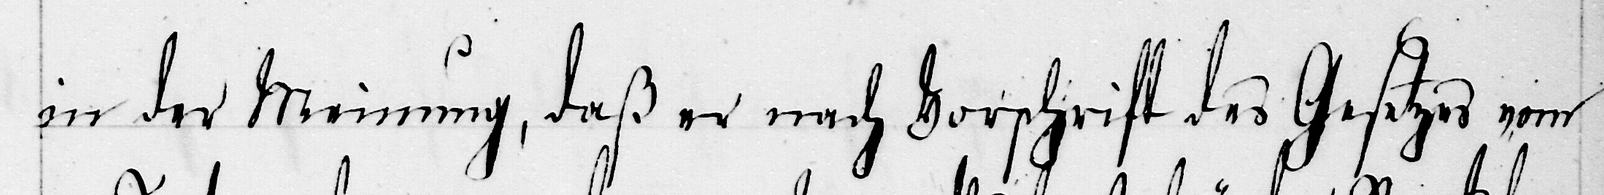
in der Meinung, daß er nach Vorschrift des Gesetzes vom
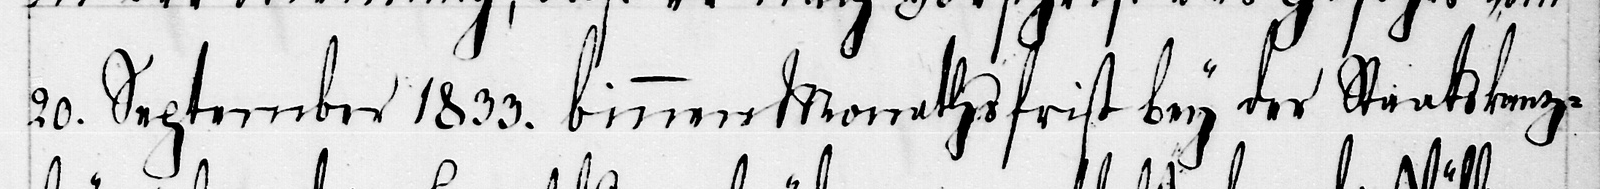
20. September 1833. binnen Monathsfrist bey der Staatskanz¬
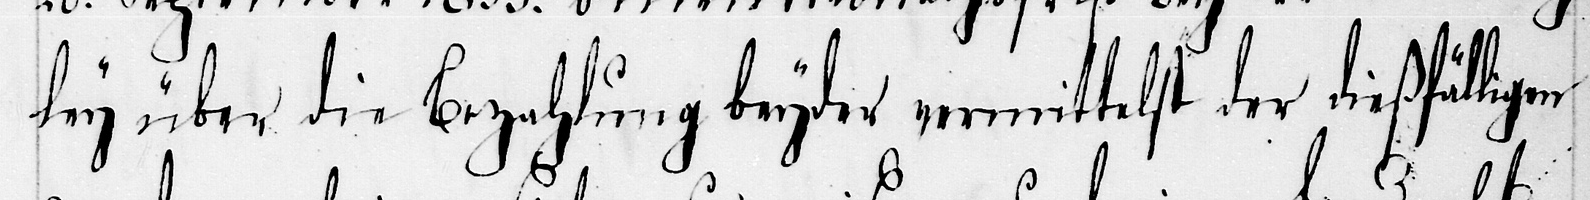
ley über die Bezahlung beyder vermittelst der dießfälli¬
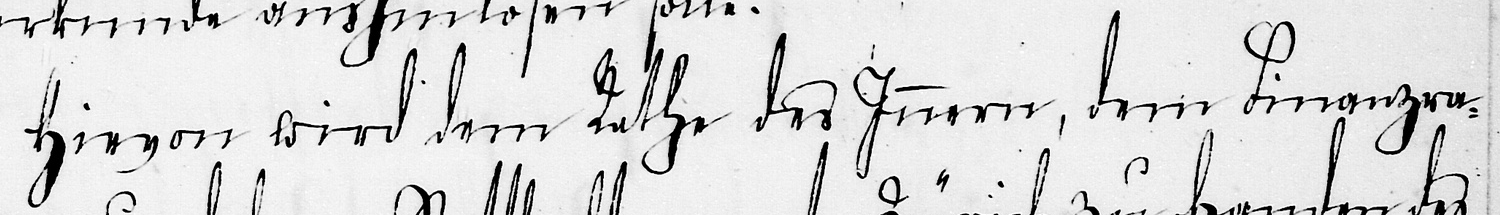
Hievon wird dem Rathe des Innern, dem Finanzra¬
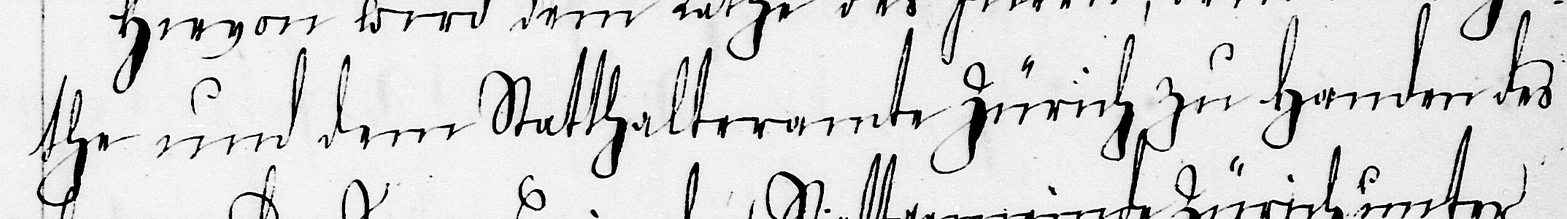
the und dem Statthalteramte Zürich zu Handen des
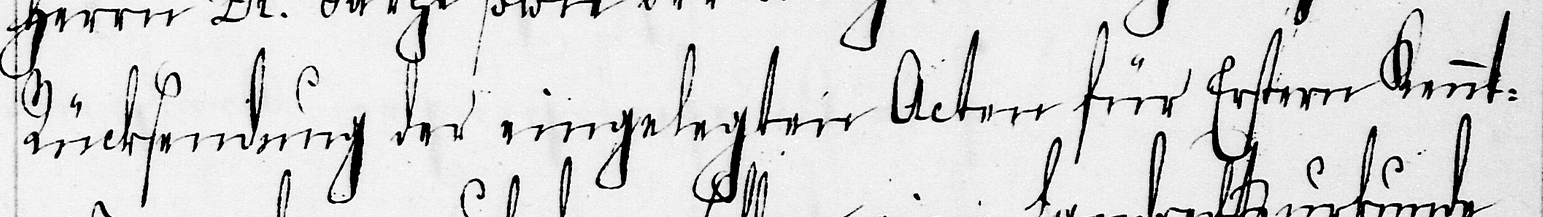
Rücksendung der eingelegten Acten für Erstern Kennt¬
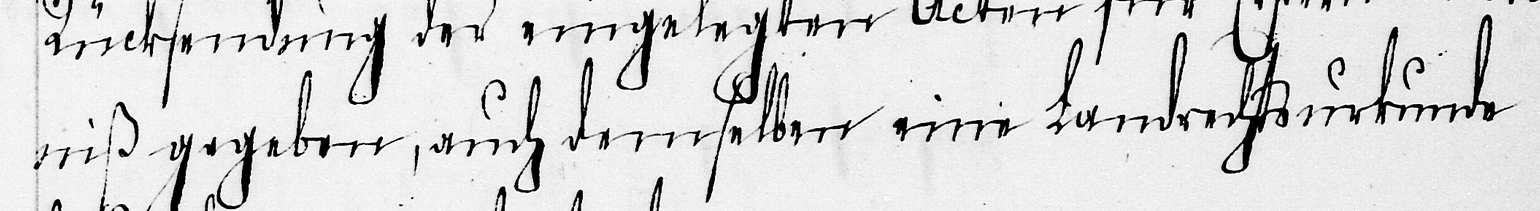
niß gegeben, auch demselben eine Landrechtsurkunde
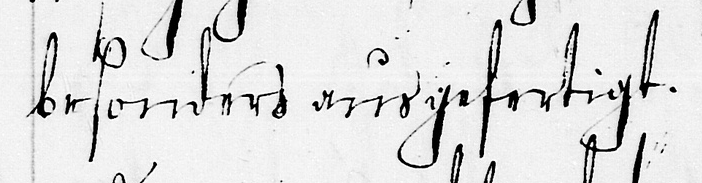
besonders ausgefertigt.
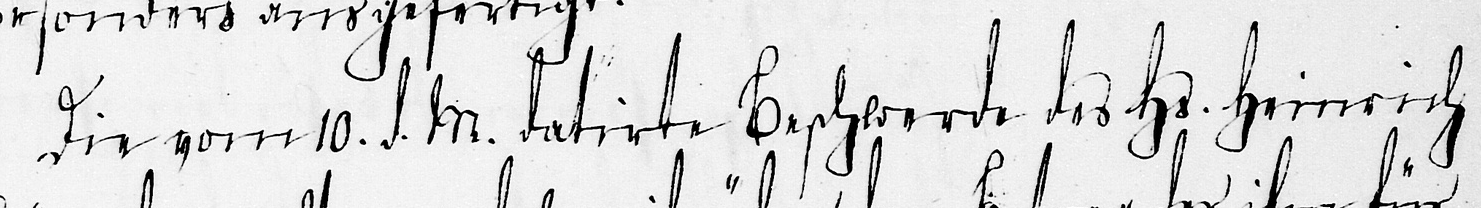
Die vom 10. d. M. datirte Beschwerde des Hs. Heinrich
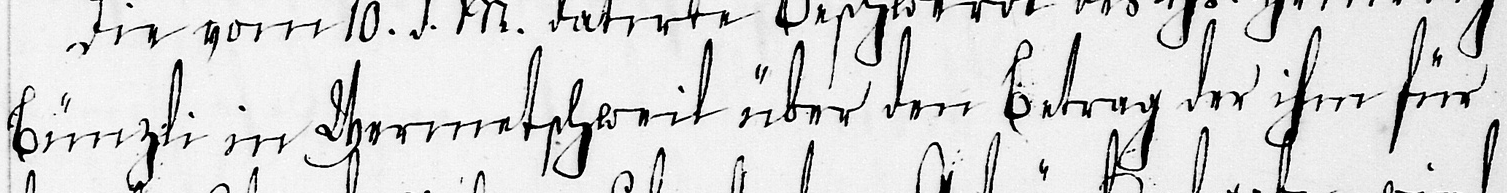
Bünzli in Wermetschweil über den Betrag der ihm für
